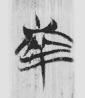南
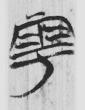𩁹
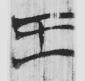王
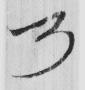乃
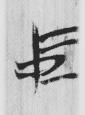𠁩
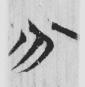分
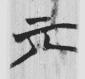亓
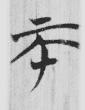帀
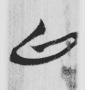㠯（以）
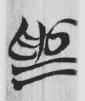爲
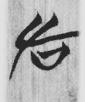左
